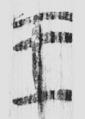王
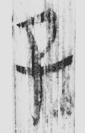子
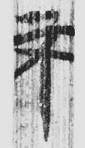不
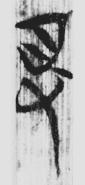𠭁
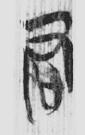君
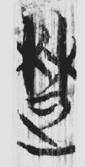楚
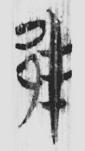邦
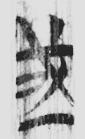或
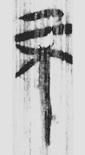不
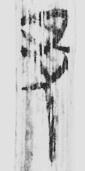𠭁
